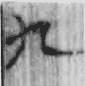九
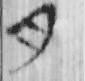月
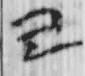己
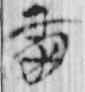梄（酉）
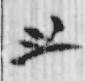之
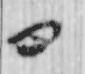日
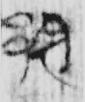陰
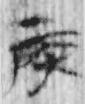侯
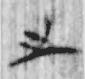之
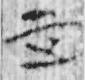正
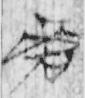差
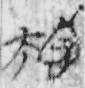○（胡）
